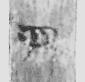四
